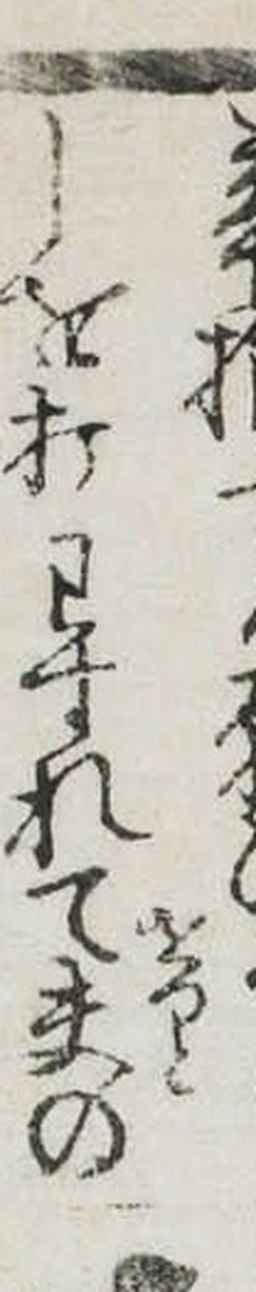しを打わすれて夫の
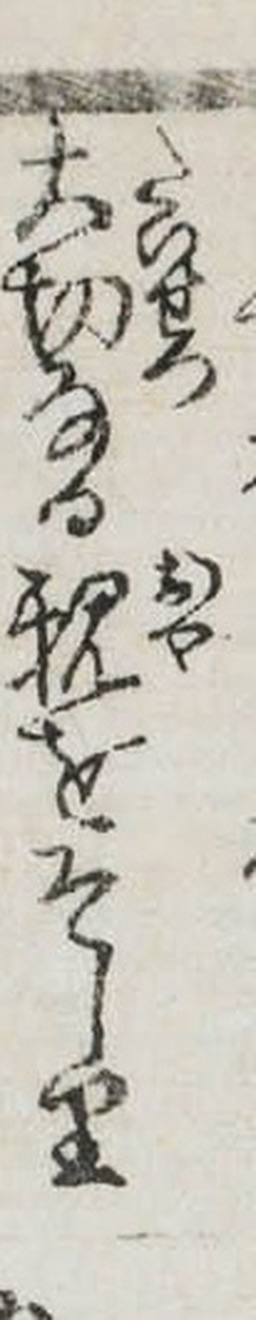大切なる親をそしり
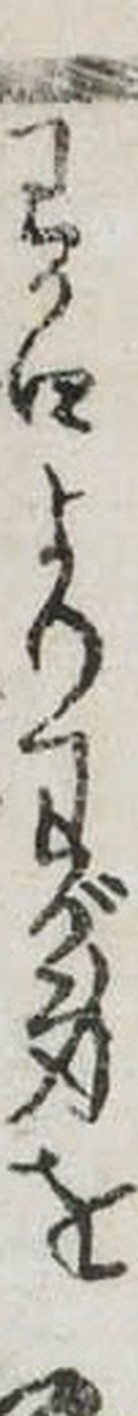わか口よりわが身を
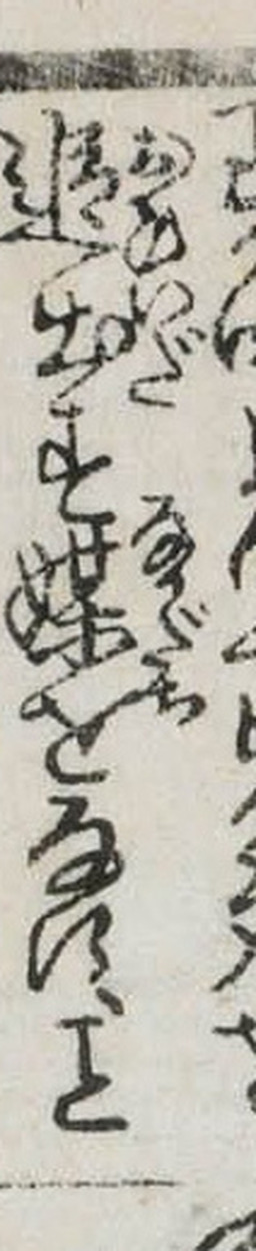追出す媒をなすこと
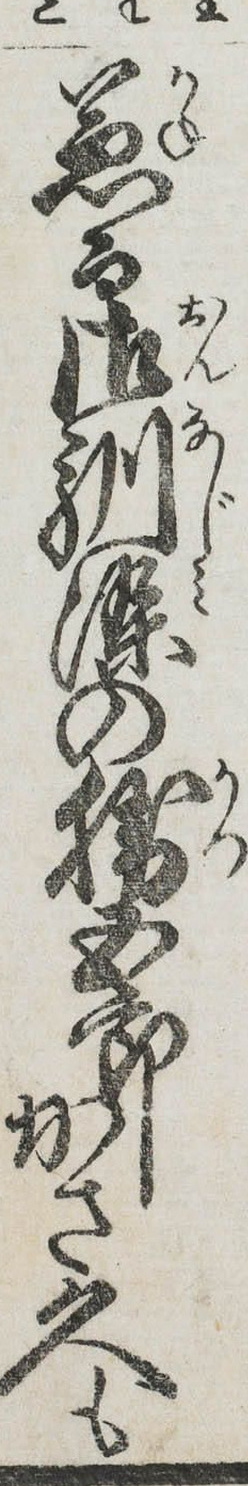兼て御馴染の勝五郎かさ久も
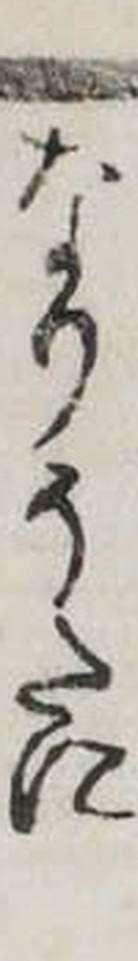なりうたに
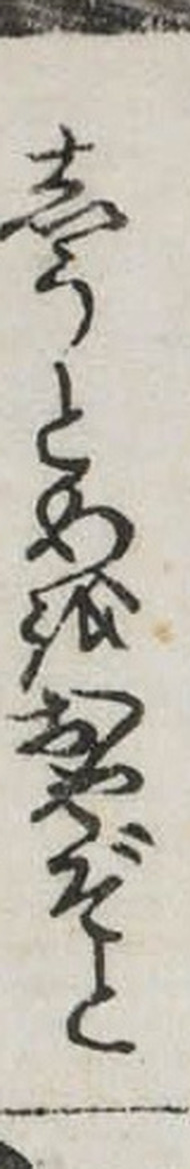しうとめをおやぞと
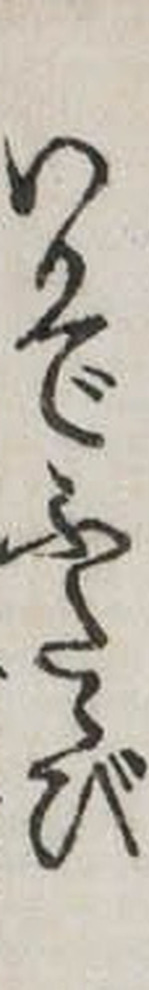いかでふたゝび
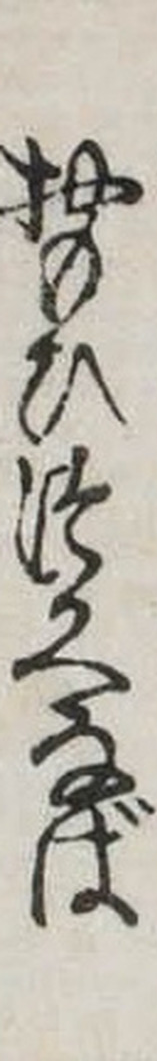おもひつかへなば
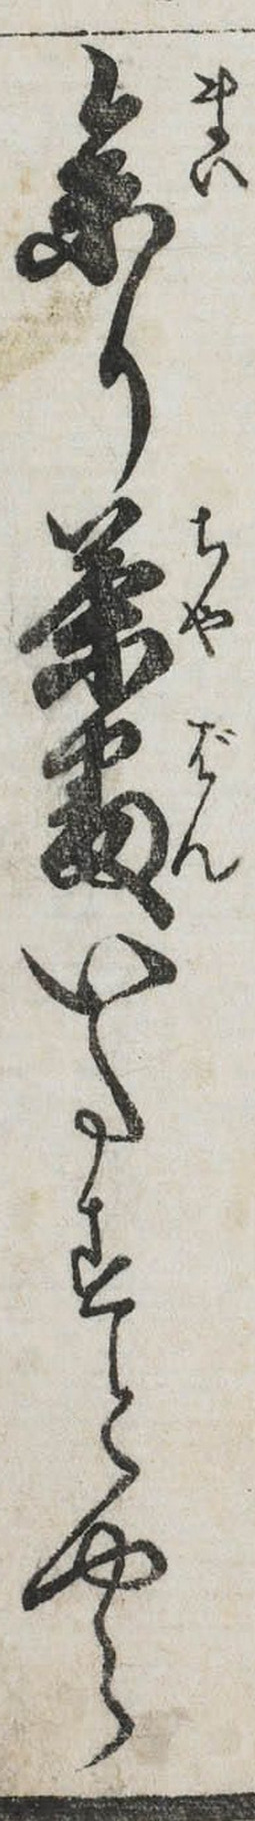参り茶番いたすとやら
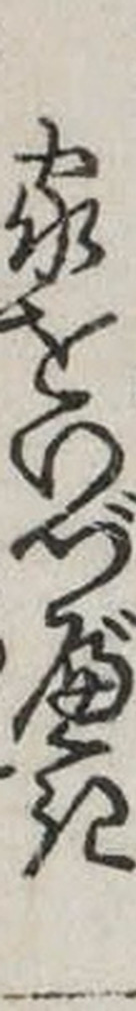家をいづべき
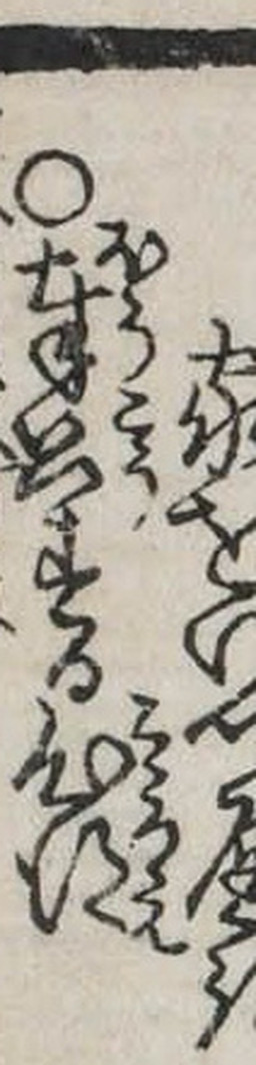○奉公する心得
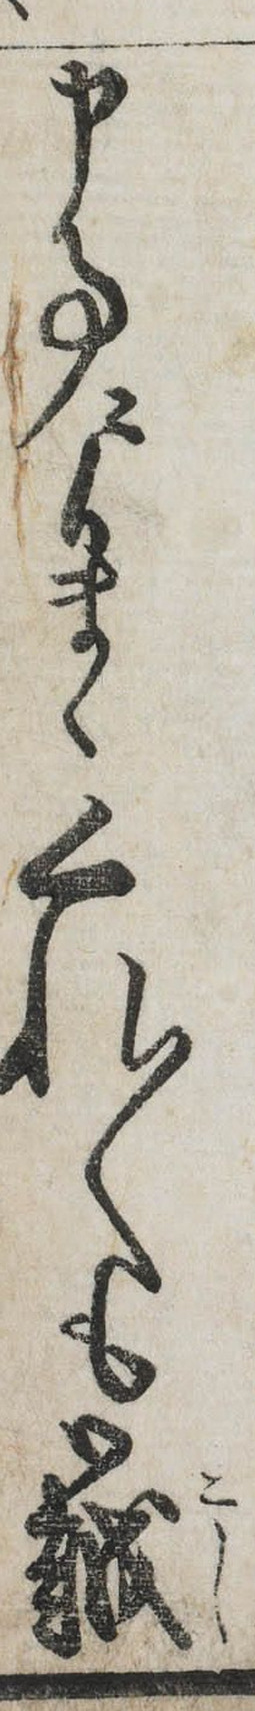申事に候まゝくれ〳〵も御越
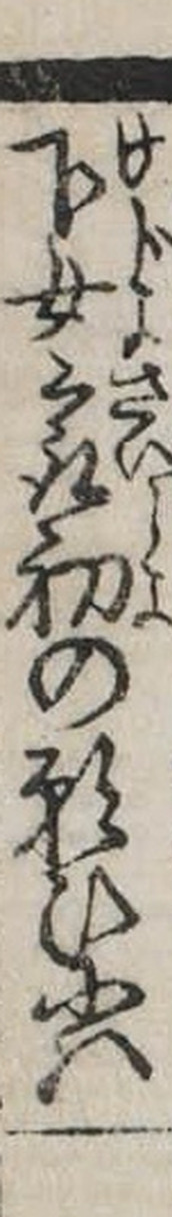下女最初の願ひには

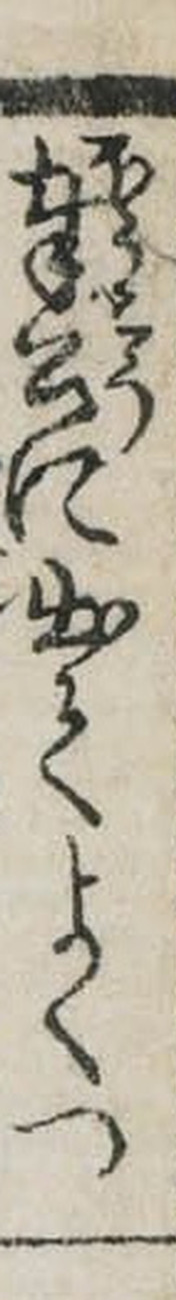奉公に出てよくつ
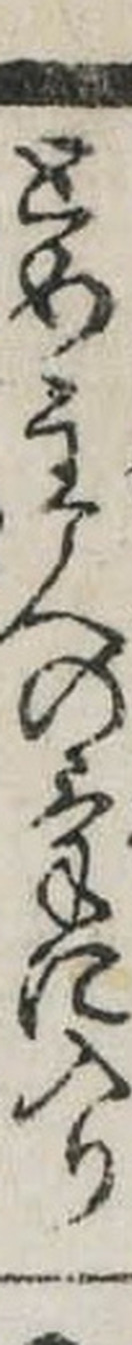とめ主人の気に入り
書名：頭書萬用婦人手紙之文言
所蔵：東京学芸大学教育コンテンツアーカイブ
